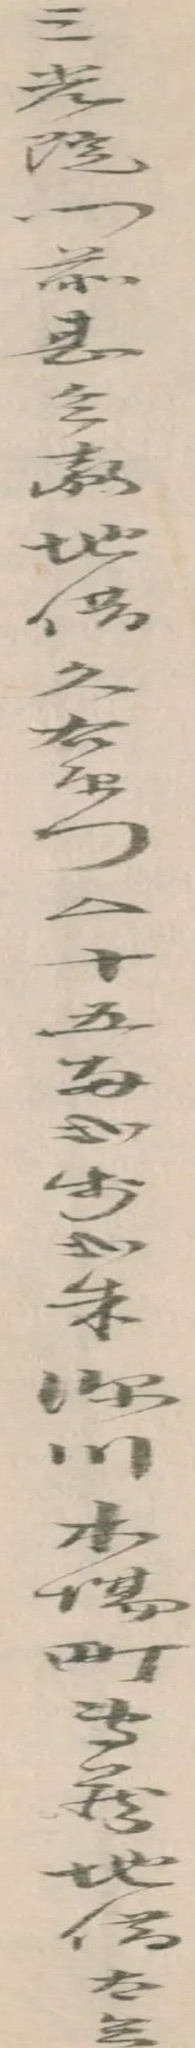三光院門前甚兵衛地借久右衛門△十五両弐歩弐朱深川木場町専蔵地借太兵
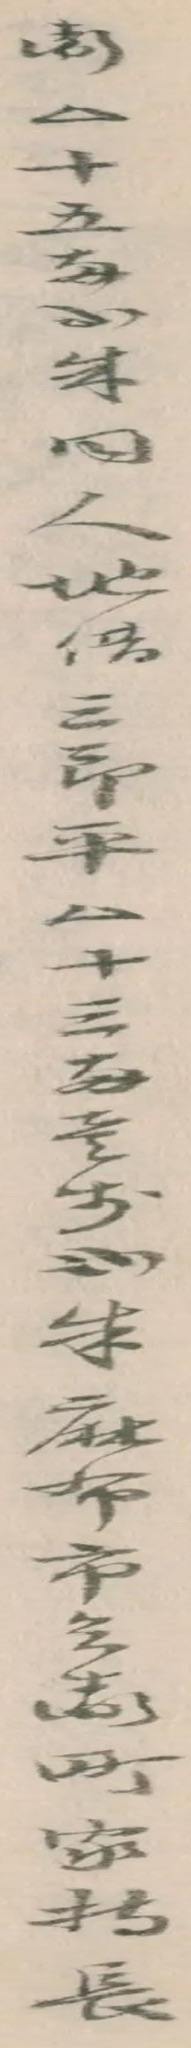衛△十五両二朱同人地借三郎平△十三両壱歩弐朱麻布市兵衛町家持長
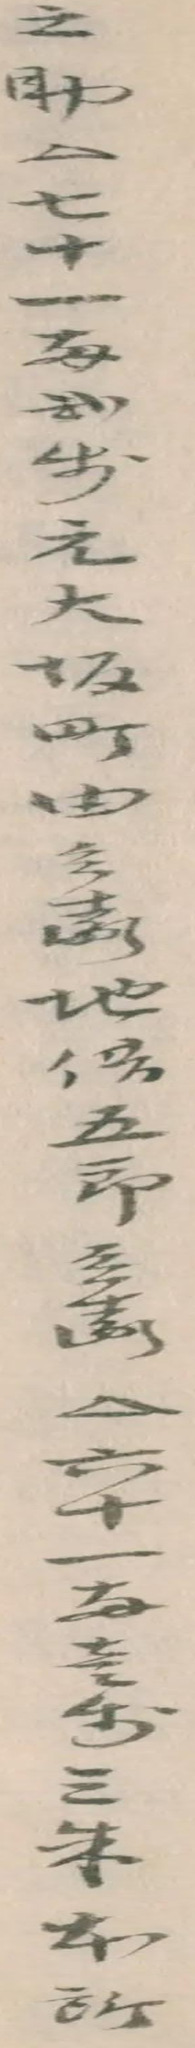之助△七十一両弐歩元大坂町由兵衛地借五郎兵衛△六十一両壱歩三朱本所
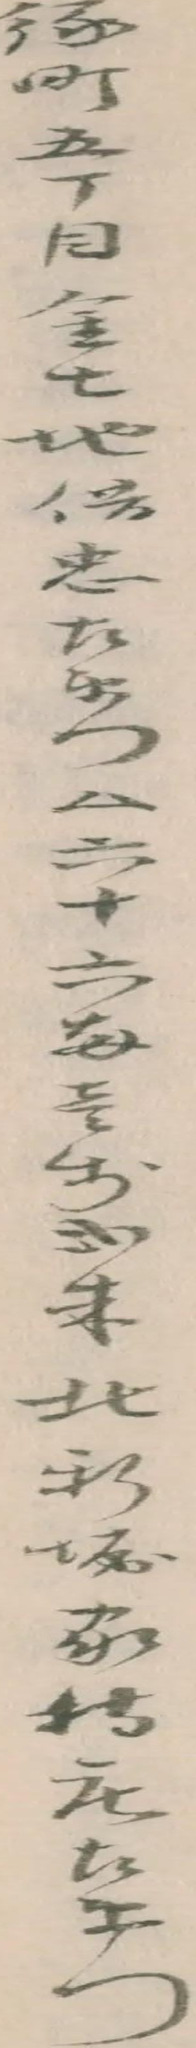緑町五丁目金七地借忠左衛門△六十六両壱歩弐朱北新堀家持庄左エ門
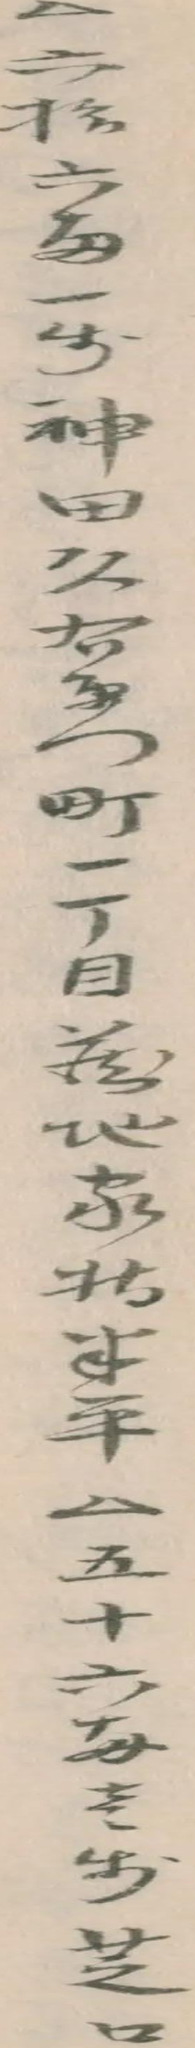△六拾六両一歩神田久右衛門町一丁目蔵地家持半平△五十六両壱歩芝口
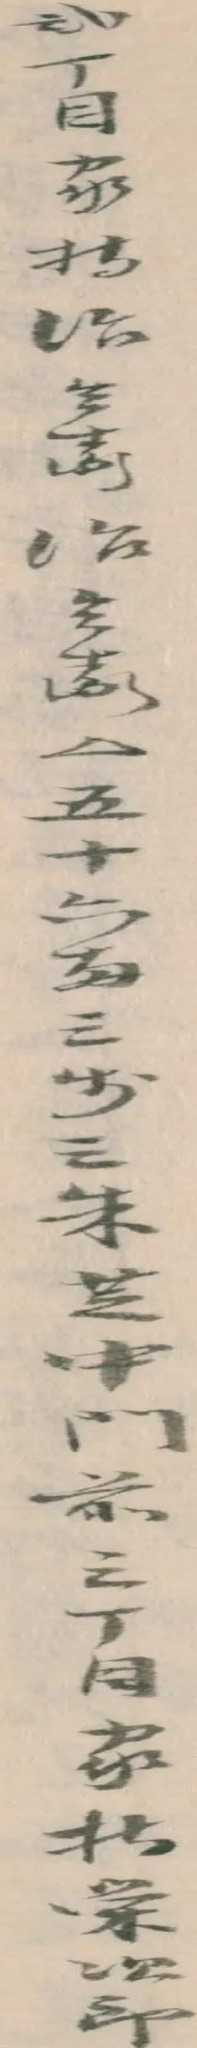弐丁目家持治兵衛治兵衛△五十六両三歩三朱芝中門前三丁目家持栄次郎
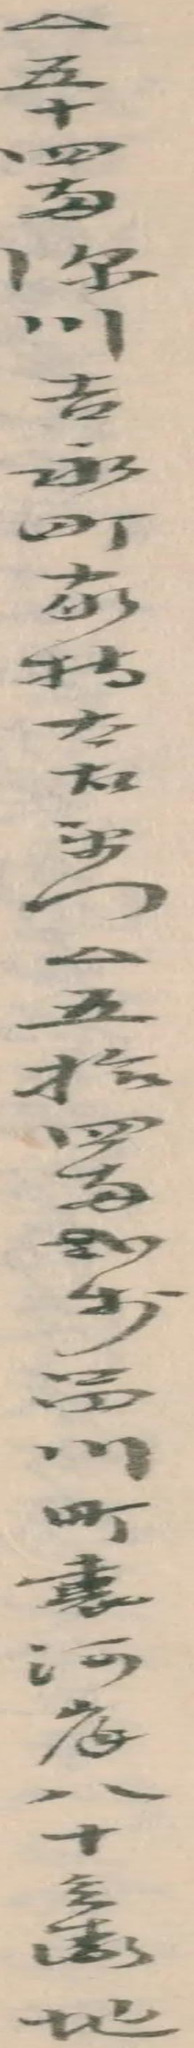△五十四両深川吉永町家持太右衛門△五拾四両弐歩品川町裏河岸八十兵衛地
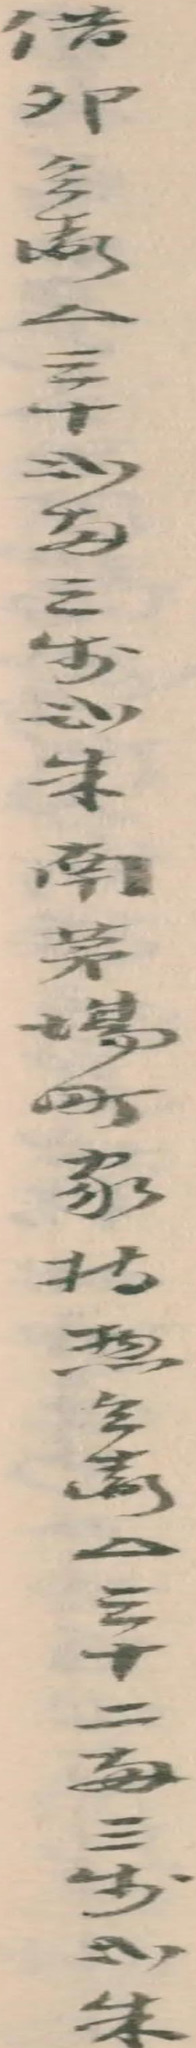借卯兵衛△三十弐両三歩弐朱南茅場町家持惣兵衛△三十二両三歩弐朱
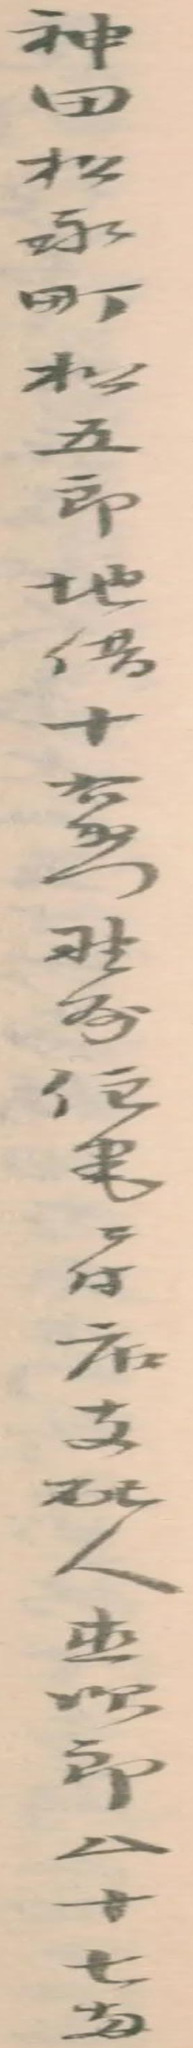神田松永町松五郎地借十右衛門野崎住宅付店支配人直次郎△十七両
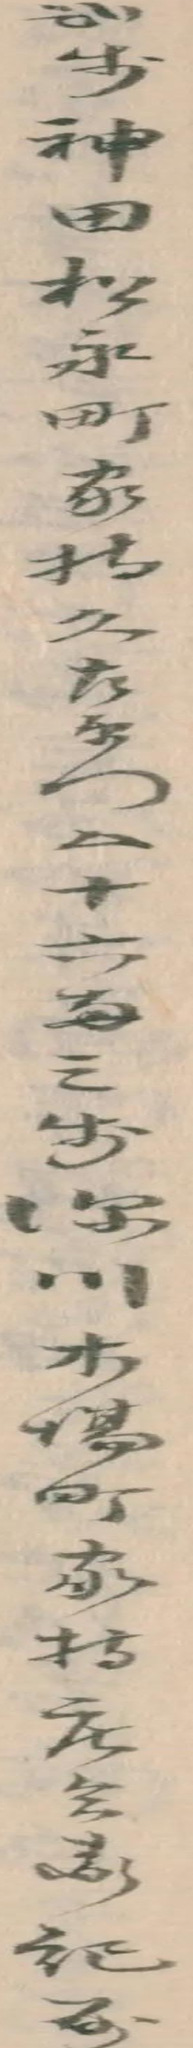弐歩神田松永町家持久左衛門△十六両三歩深川木場町家持庄兵衛紀州
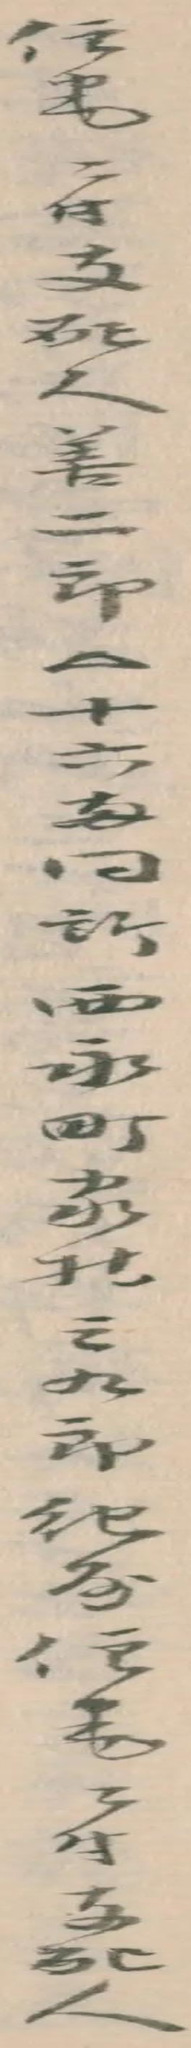住宅付支配人善二郎△十六両同所西永町家持三九郎紀州住宅付支配人
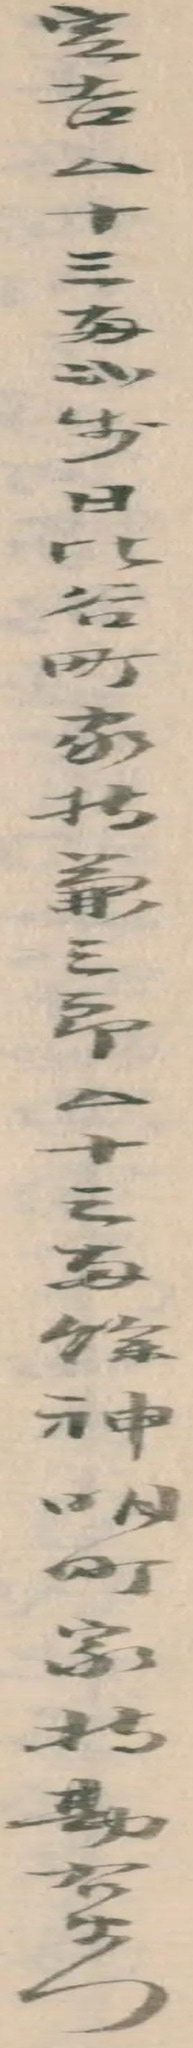定吉△十三両弐歩日比谷町家持兼三郎△十三両余神明町家持勘右衛門
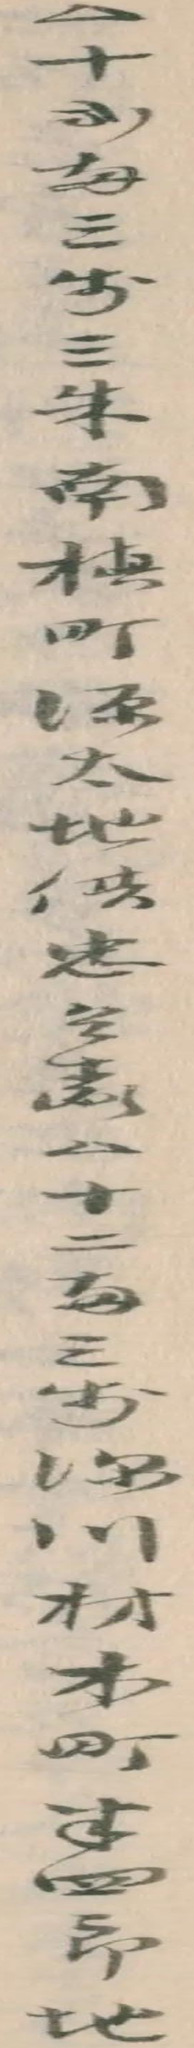△十弐両三歩三朱南槙町源太地借忠兵衛△十二両三歩深川材木町半四郎地
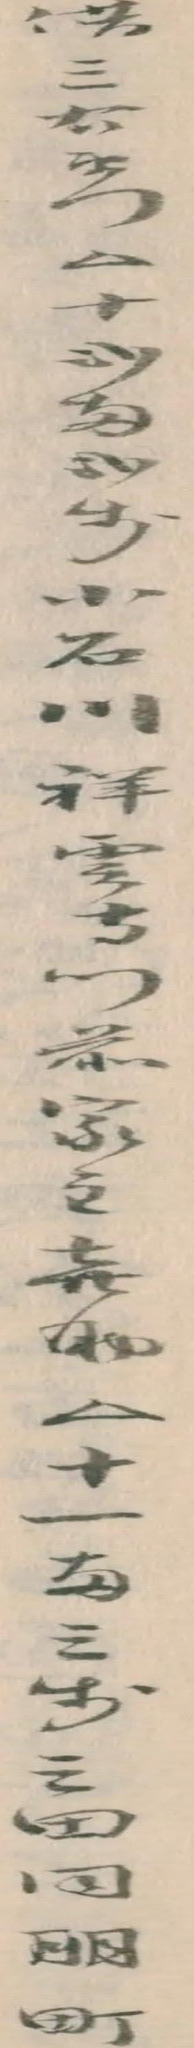借三右衛門△十弐両弐歩小石川祥雲寺門前家主喜助△十一両三歩三田同朋町
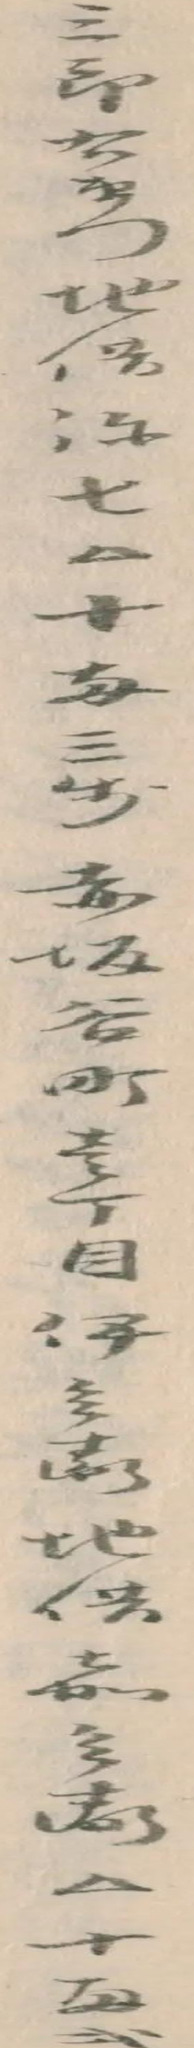三郎右衛門地借弥七△十両三歩赤坂谷町壱丁目伊兵衛地借嘉兵衛△十両弐
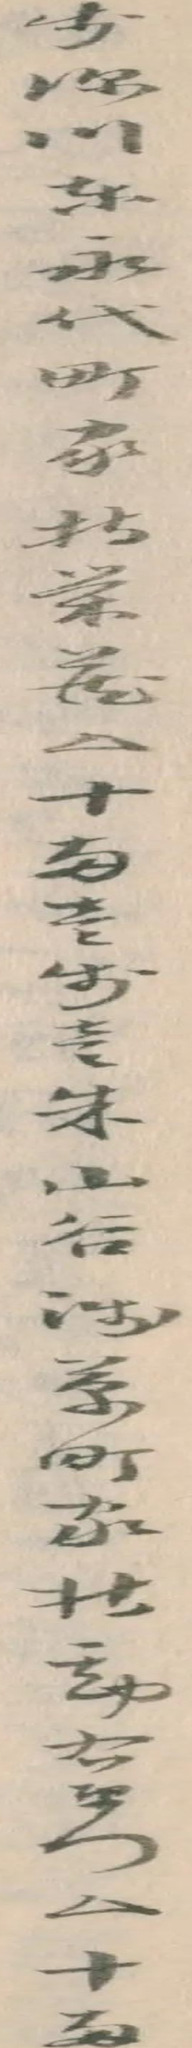歩深川東永代町家持栄蔵△十両壱歩壱朱山谷浅草町家持勘右衛門△十両
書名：地災撮要. 巻10(地震之部) 上,下
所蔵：国立国会図書館 National Diet Library, JAPAN
